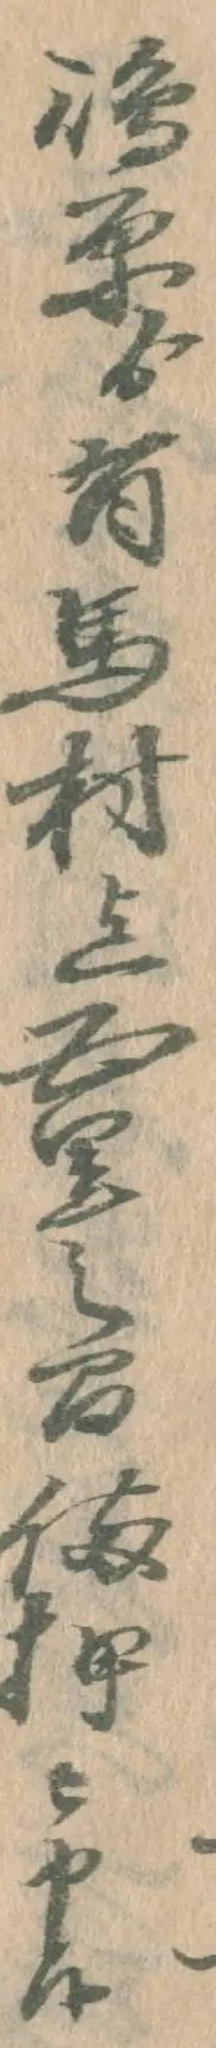島原ゟ有馬村迄五里之間備押被申候
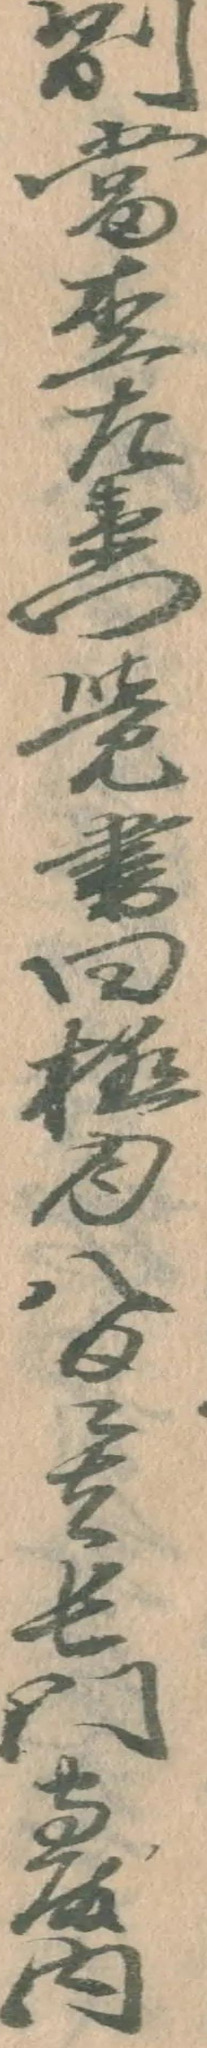別当杢左衛門覚書曰極月八日に者長門守殿内
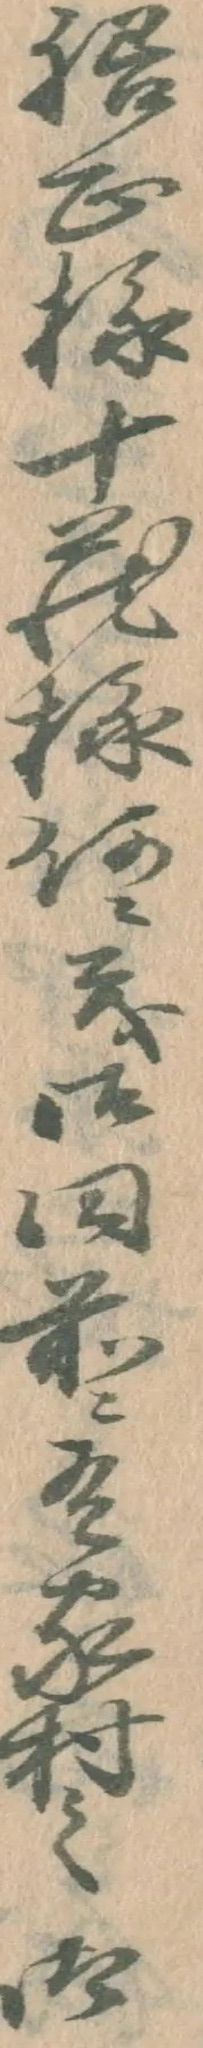善正様十蔵様何に茂御同前に有家村之御
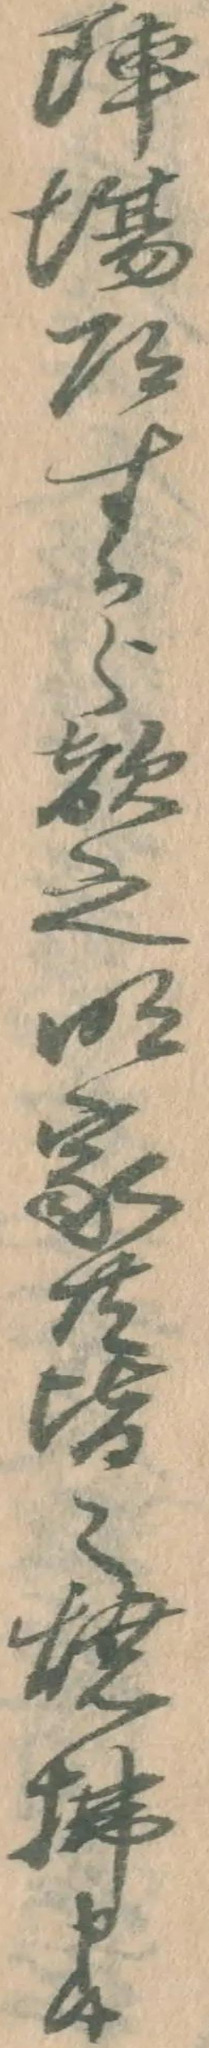陣場道すから敵之明家共皆々焼払申候

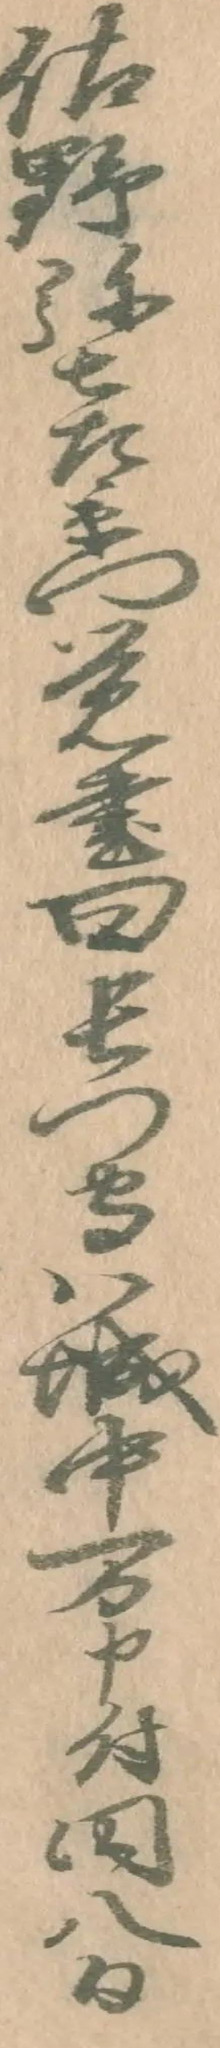佐野弥七左衛門覚書曰長門守は城中万申付同八日
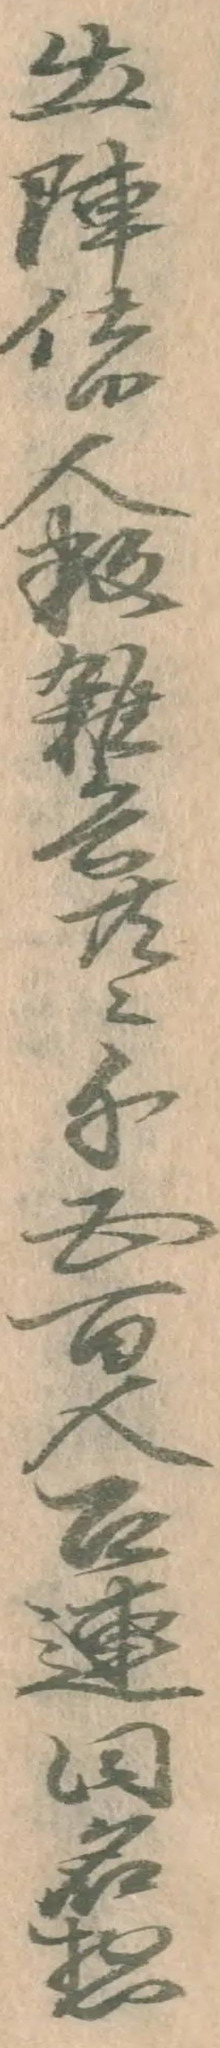出陣仕候人数雑兵共に千五百人召連同名惣
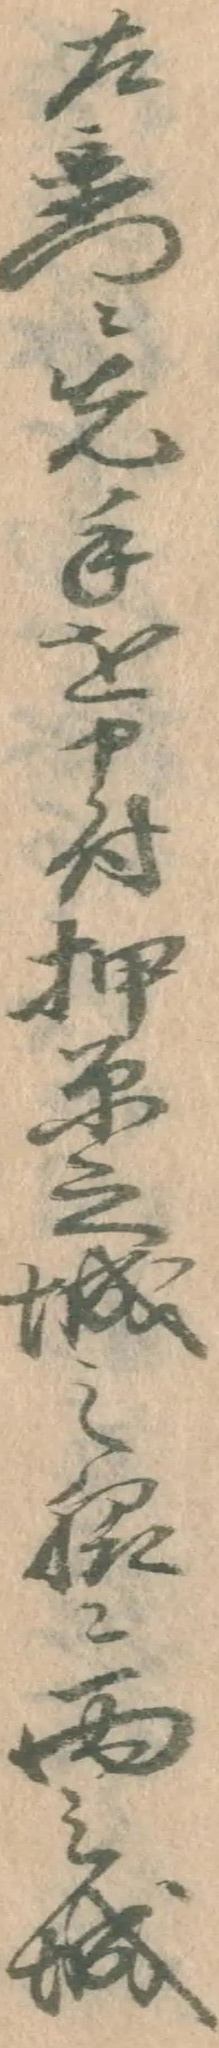左衛門に先手を申付押原之城之脇に西之城
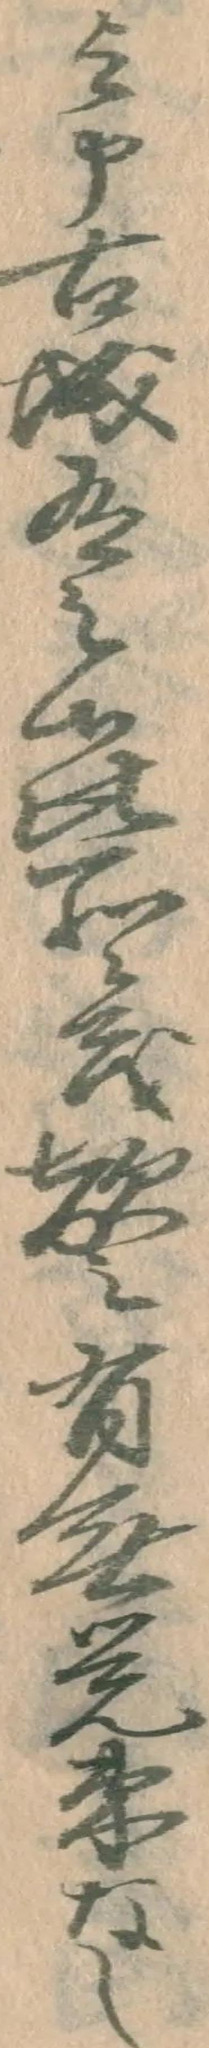与申古城有之候此所に茂敵之有無覚束なし
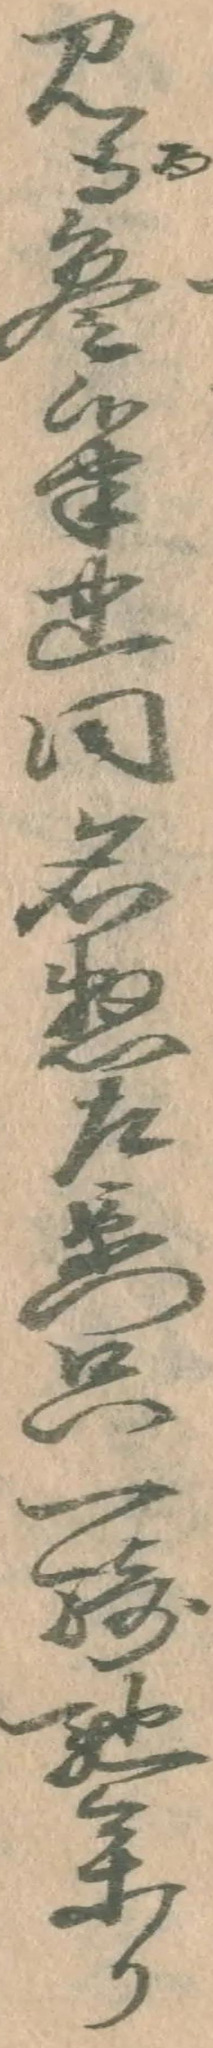見而参候半迚同名惣左衛門只一騎馳参り
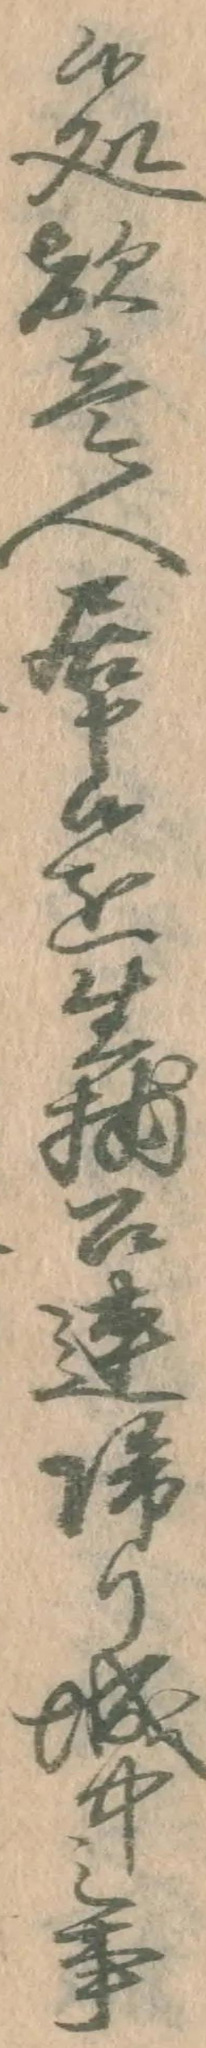候処敵壱人居申候を生捕召連帰り城中之事
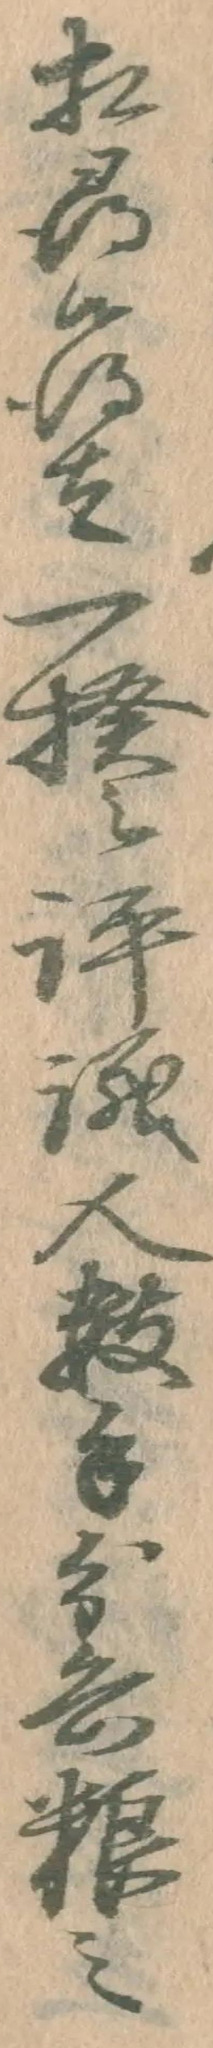相尋候得者一揆之評議人数手分兵粮之
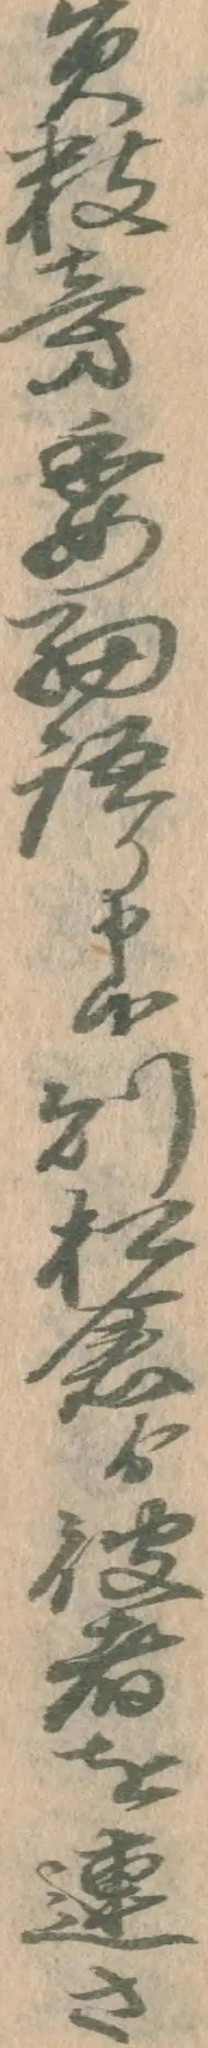負数旁委細語り申候則松倉ゟ彼者を連さ
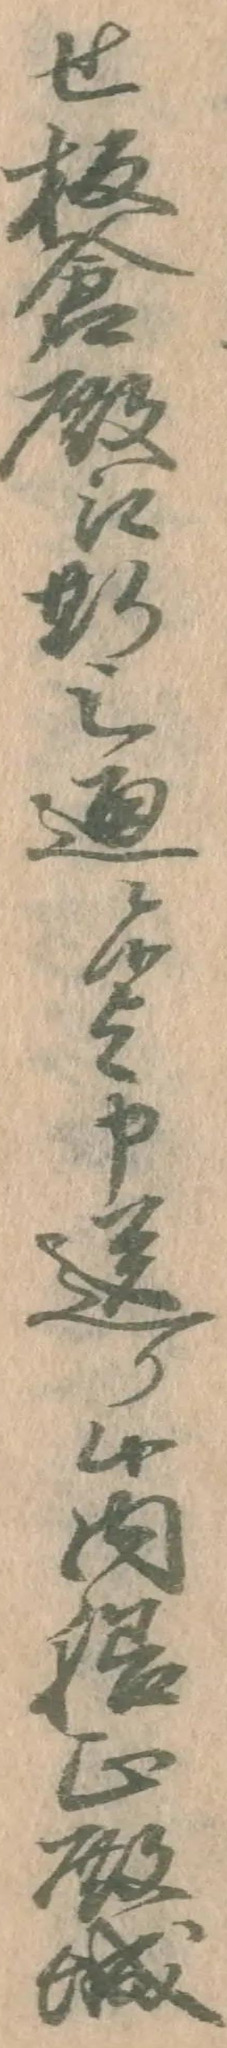せ板倉殿江斯之通に候与申送り候内膳正殿城
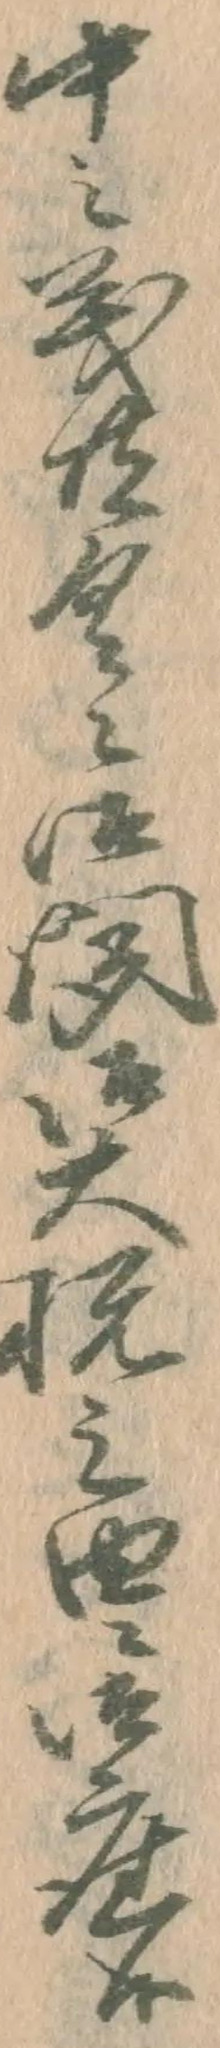中之義共具に御聞御大悦之由に御座候
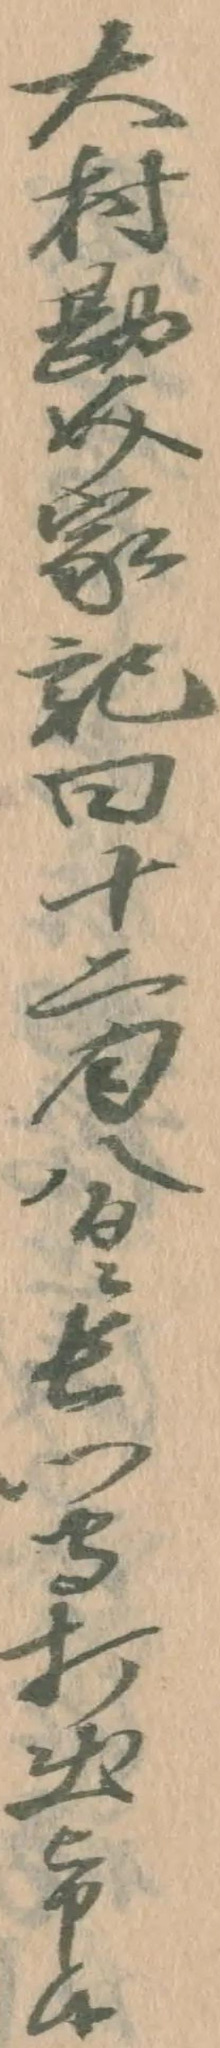大村勘介家記曰十二月八日に長門守打出被申候
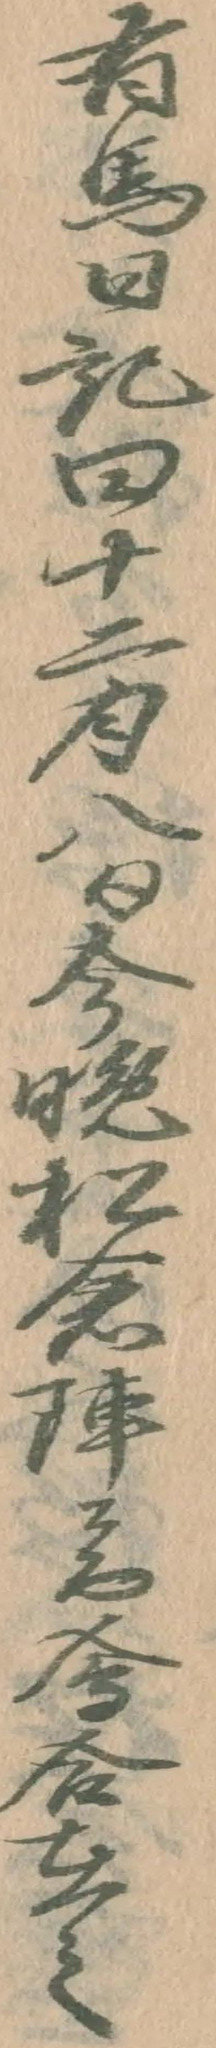有馬日記曰十二月八日今晩松倉陣に而会合在之
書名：切支丹御退治記 49巻. [4]
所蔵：国立国会図書館 National Diet Library, JAPAN
